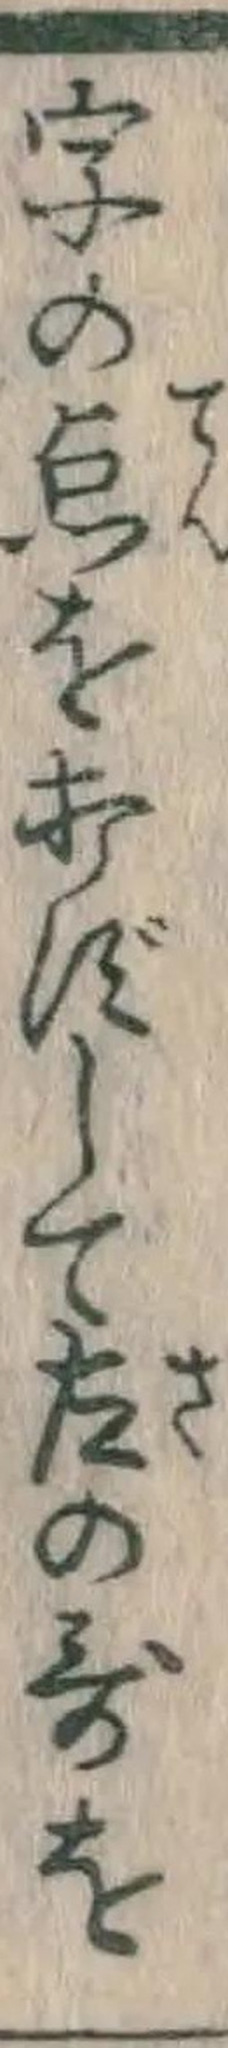字の点を打ずして左の歌を
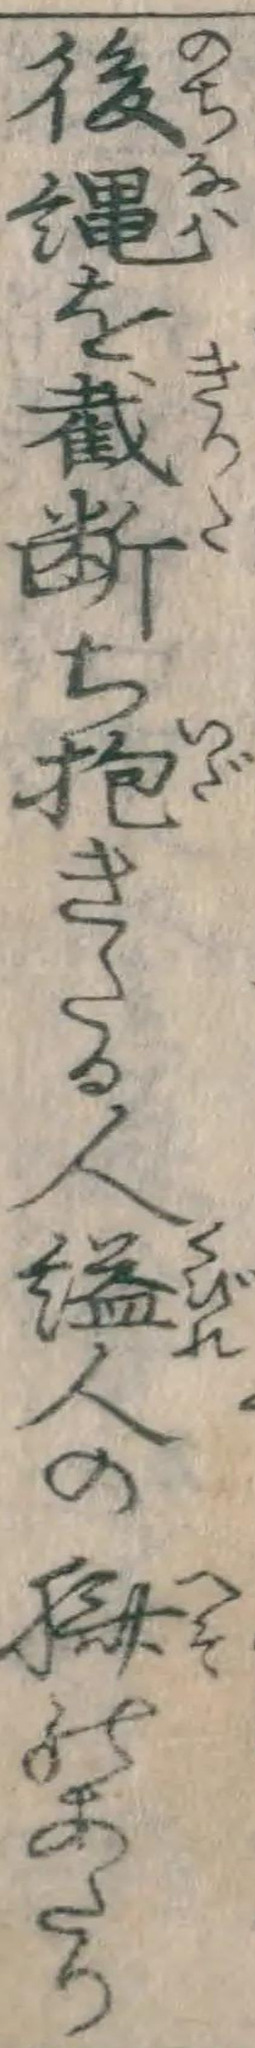後縄を截断ち抱きたる人縊人の臍のあたり
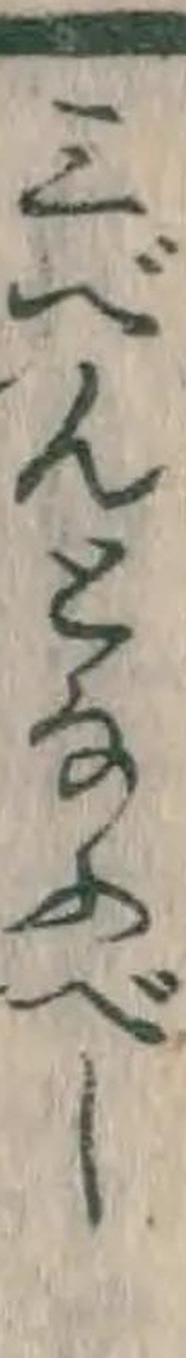三べんとなふべし
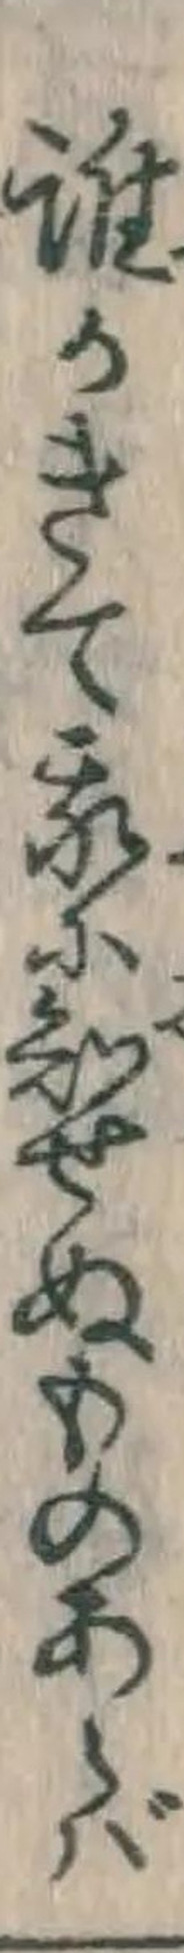誰かきて我に知せぬものあらば
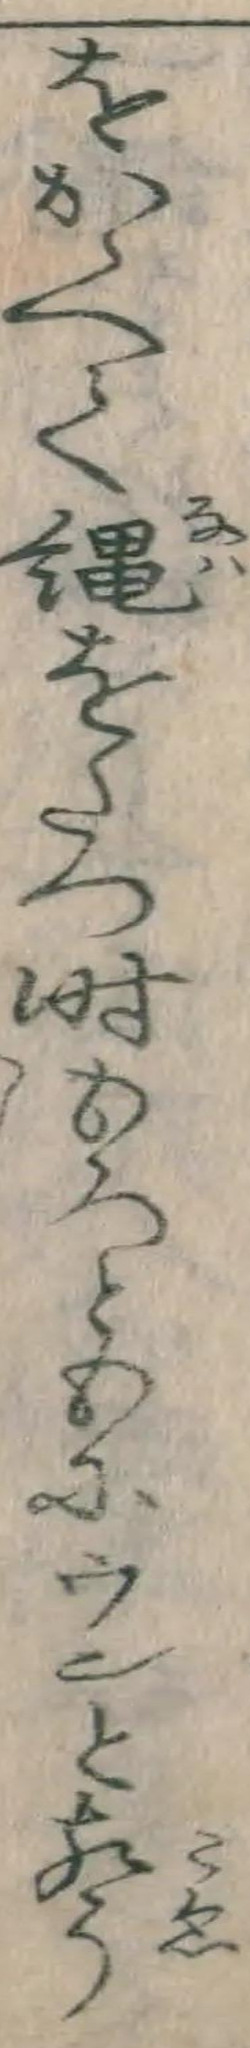をかゝへて縄をたつ時もろともにウンと声
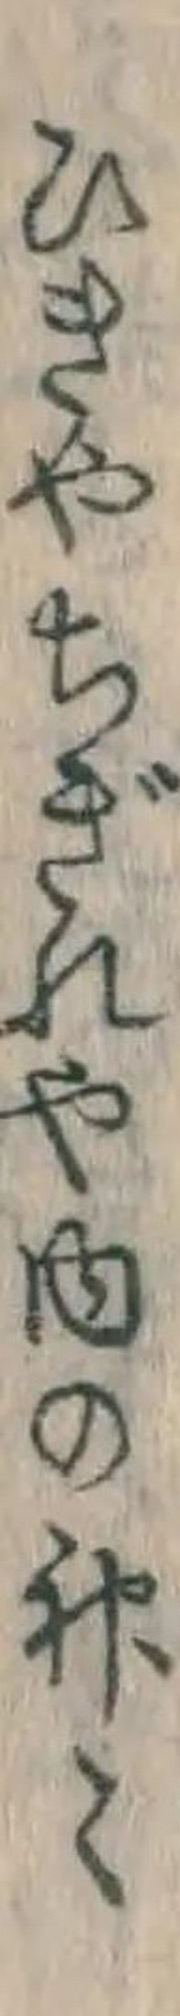ひきやちぎれや内の神々
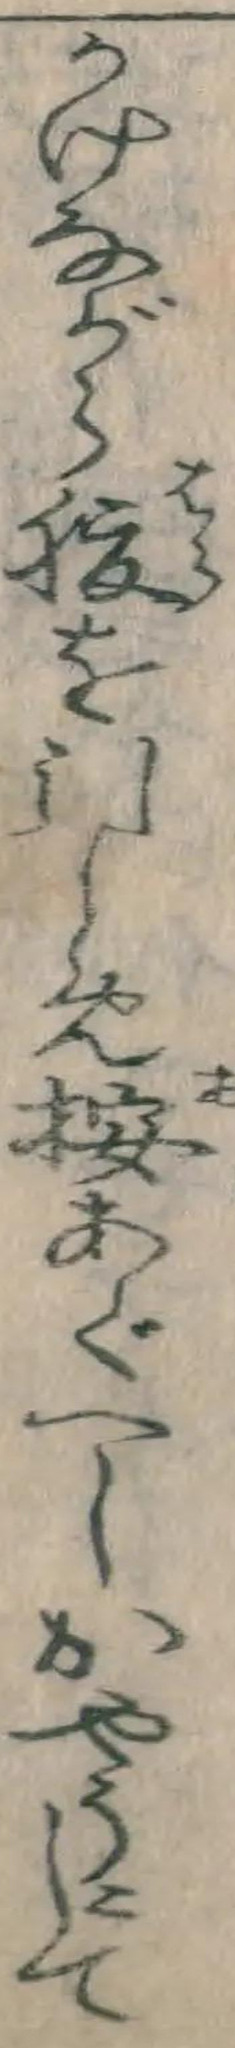かけながら腹を引しめ按あぐへしかやうにして

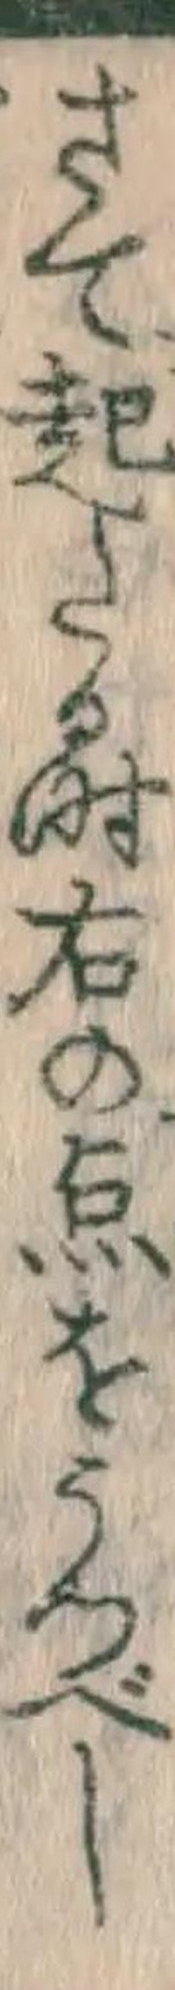さて起たる時右の点をうつべし
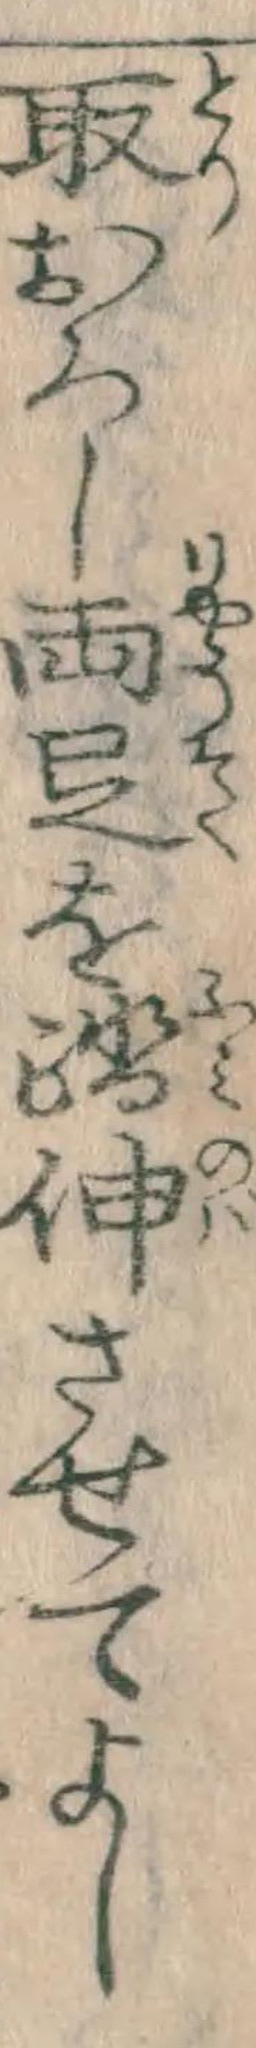取おろし両足を踏伸させてよし
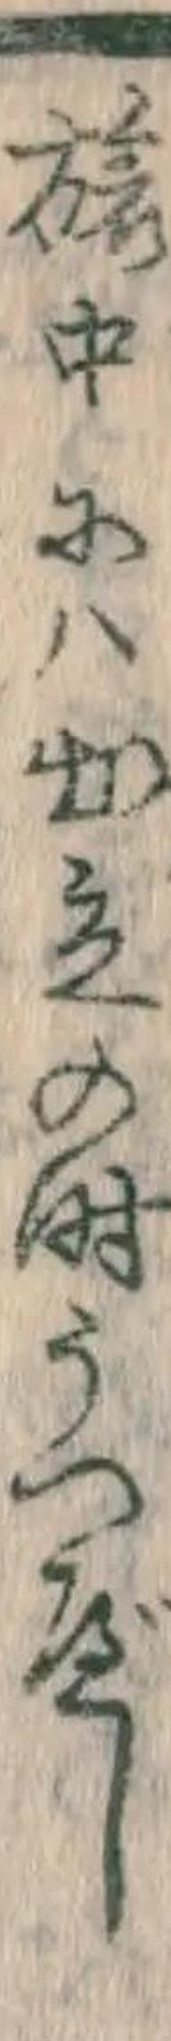旅中には出立の時うつべし
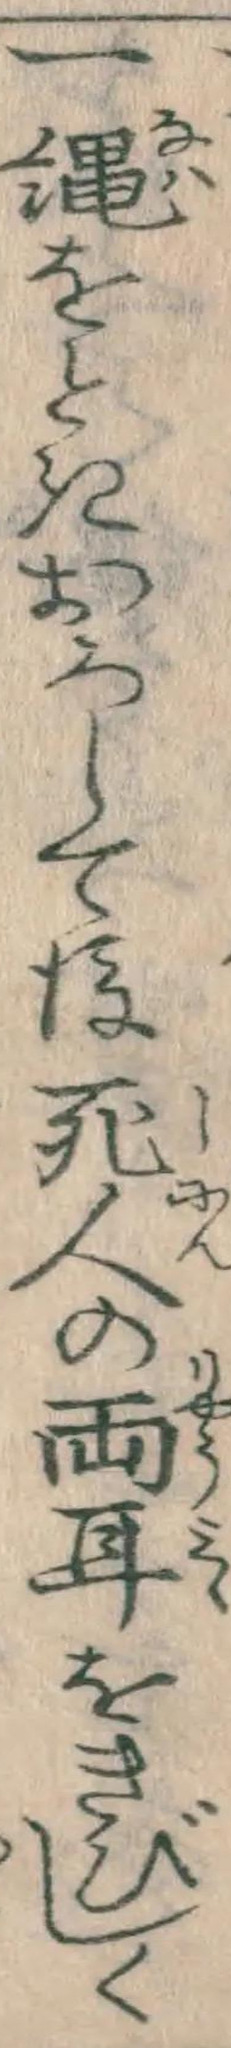一縄をときおろして後死人の両耳をきびしく
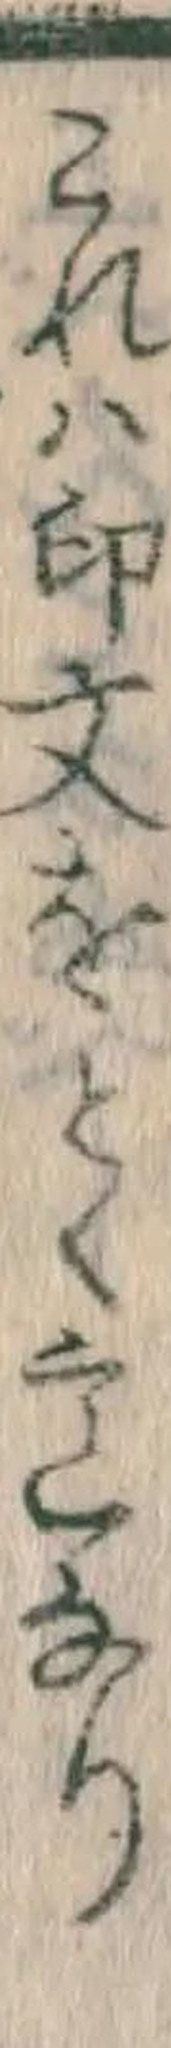これは印文をとく意なり
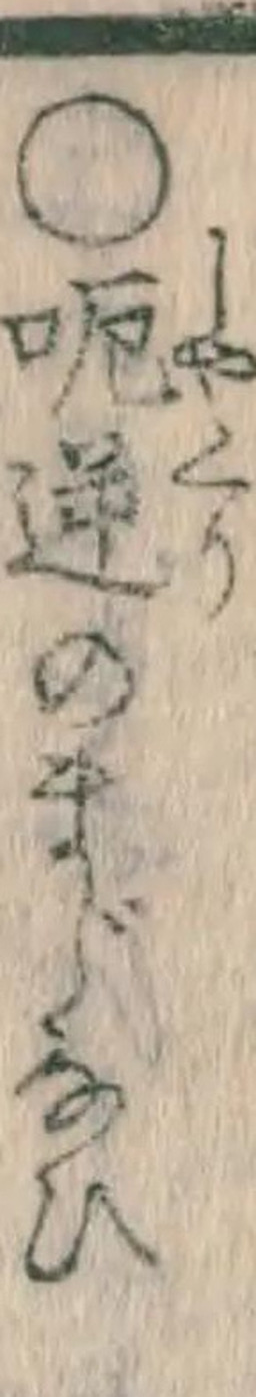○呃逆のまじなひ
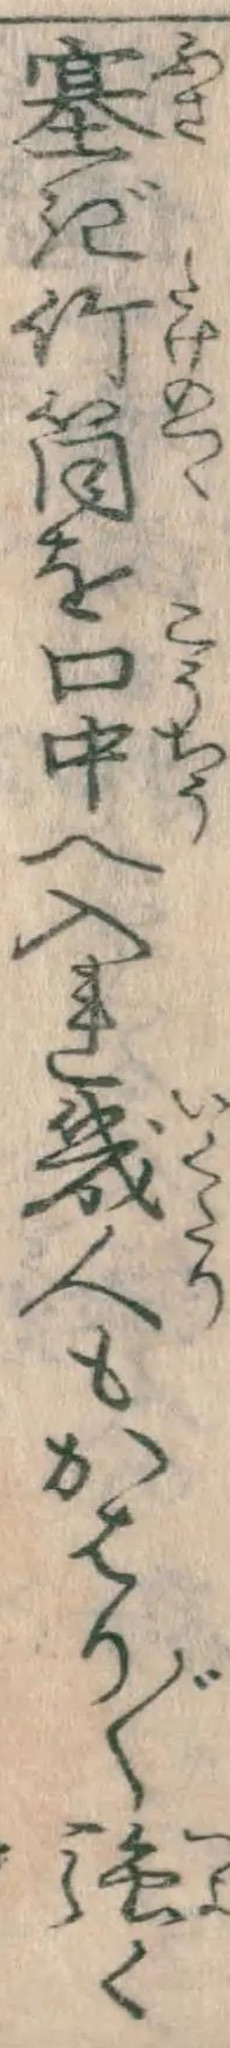塞ぎ竹筒を口中へ入れ幾人もかはり〴〵強く
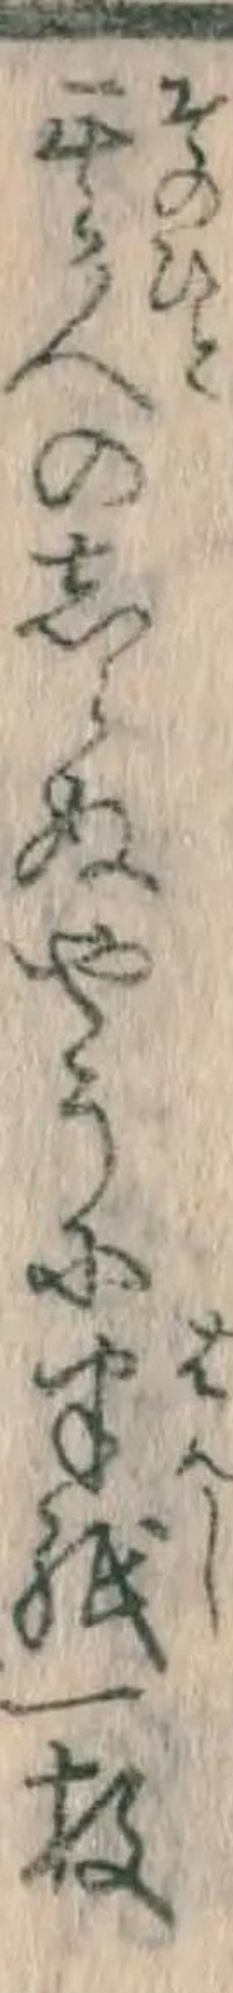其人のしらぬやうに半紙一枚
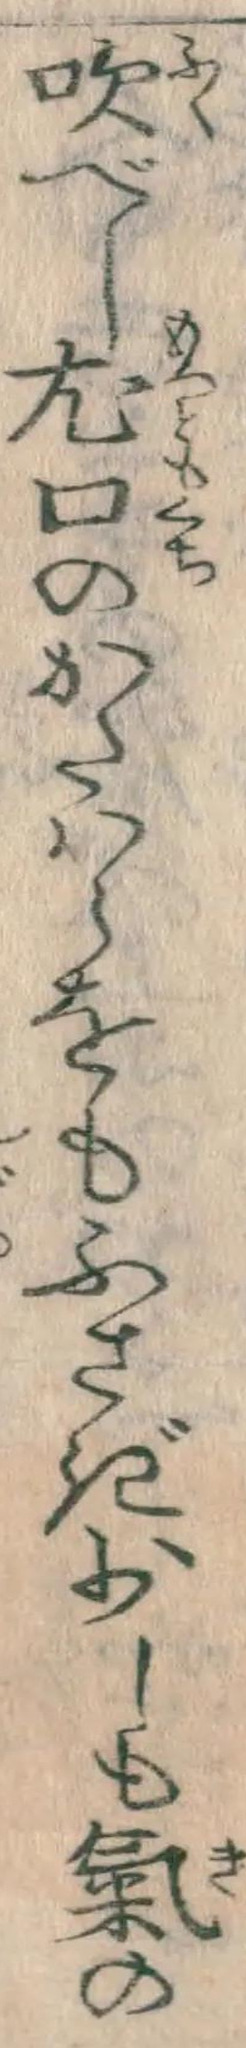吹べし尤口のかたはらをもふさぎ少しも気の
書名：広益秘事大全 3巻. [4]
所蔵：国立国会図書館 National Diet Library, JAPAN
